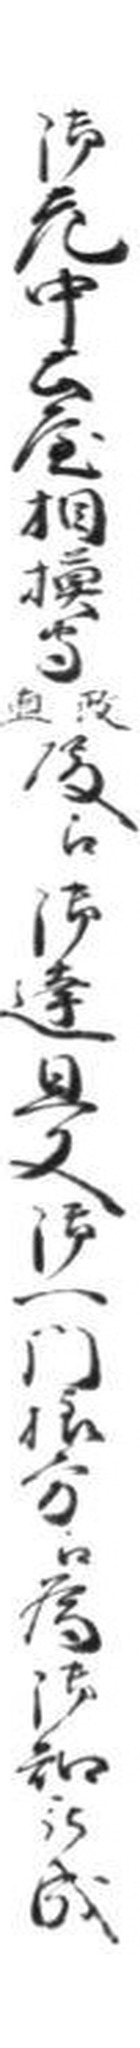御老中土屋相模守政直殿江御達又御一門様方江為御知被成
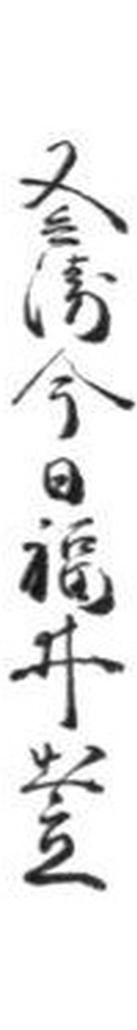又兵衛今日福井出立
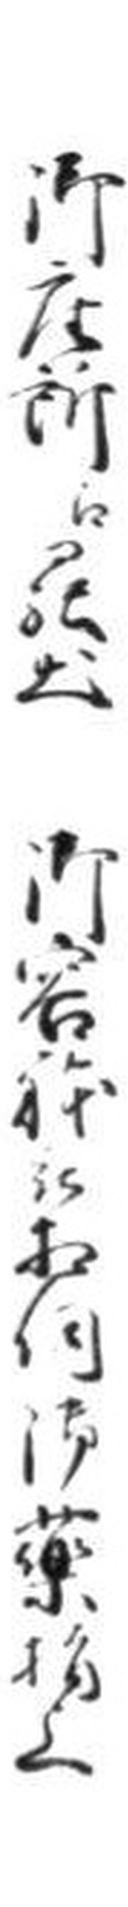御座所江罷出御容体被相伺御薬指上
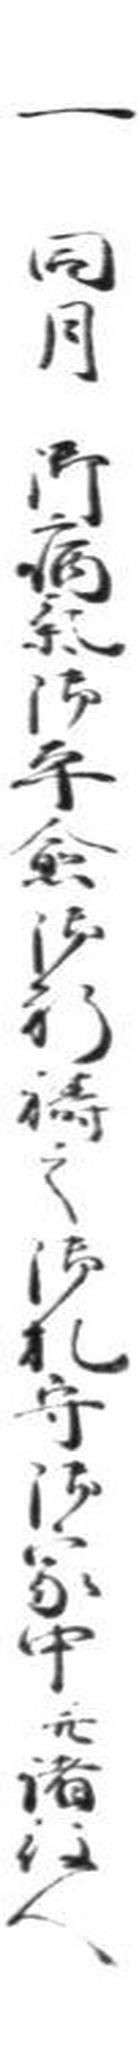一同月御病気御平愈御祈祷之御札守御家中并諸役人
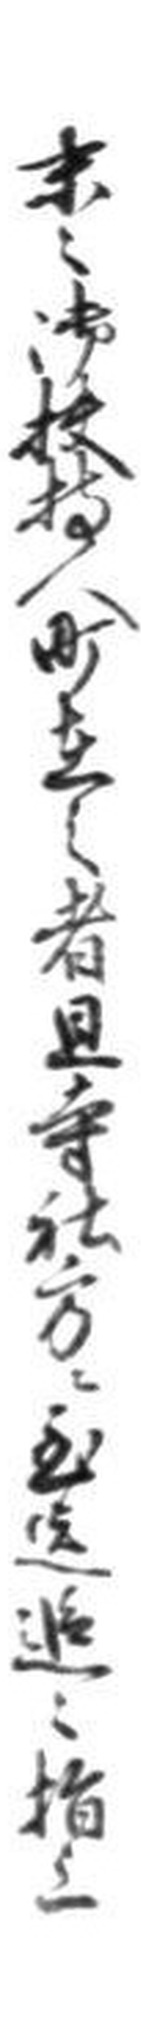末々御扶持人町在之者且寺社方ニ至迄追々指上
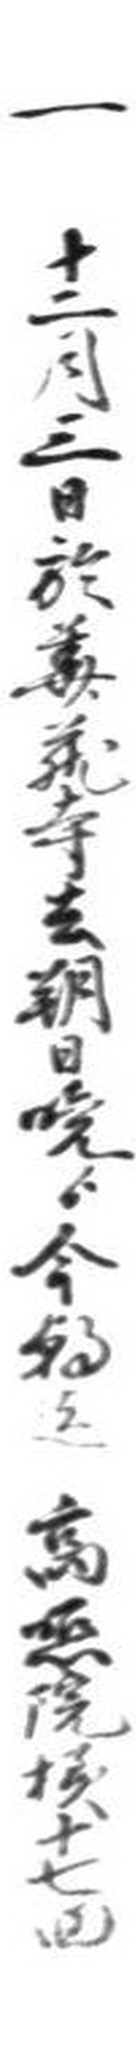一十二月三日於華蔵寺去朔日暁ゟ今朝迄高照院様十七回
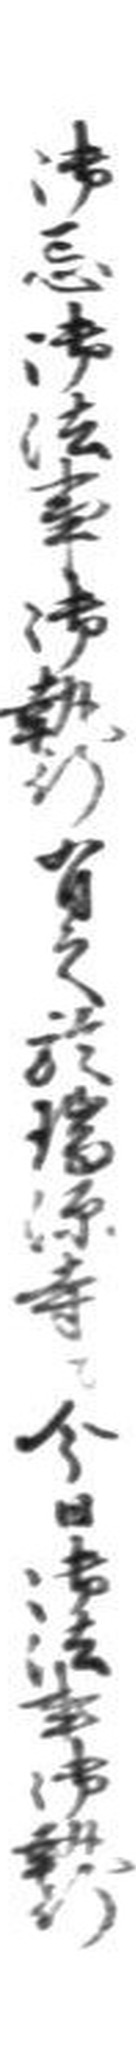御忌御法事御執行有之於瑞源寺も今日御法事御執行
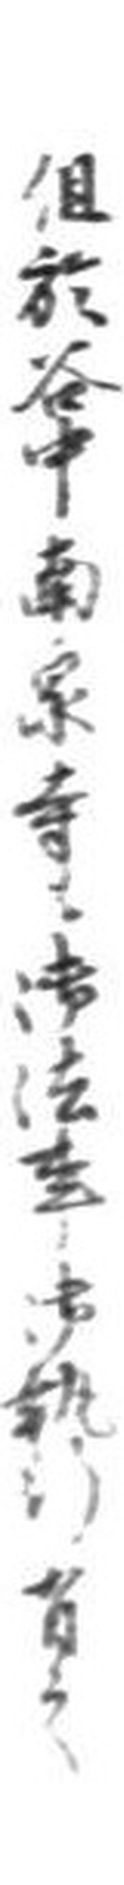但於谷中南泉寺も御法事御執行有之
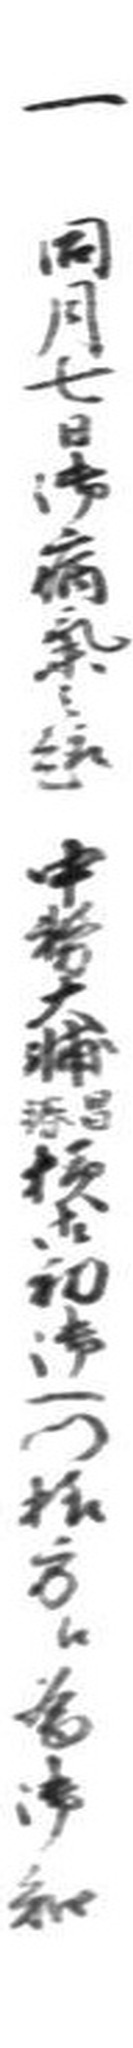一同月七日御病気之趣中務大輔昌勝様初御一門方江為御知
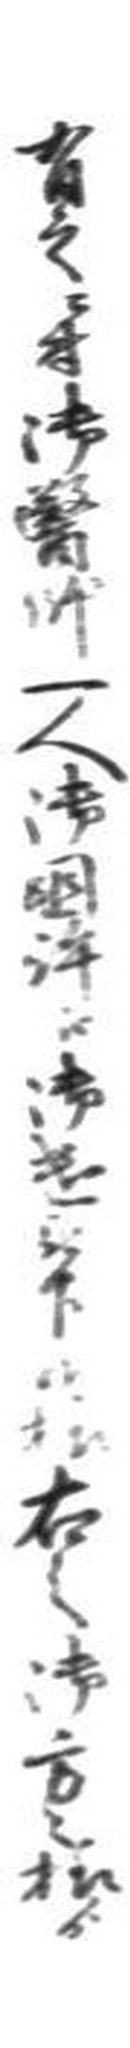有之二付御医師一人御国許江御遣被下候様右之御方々様ゟ
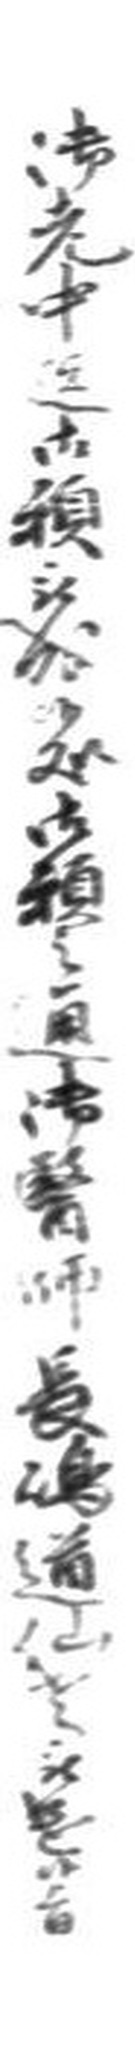御老中迄御願被成候処御願之通御医師長嶋道仙老被遣候旨
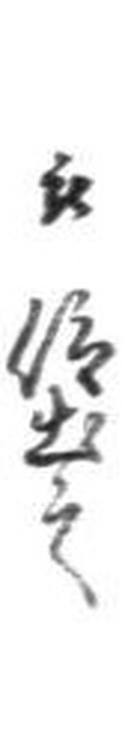被仰出之

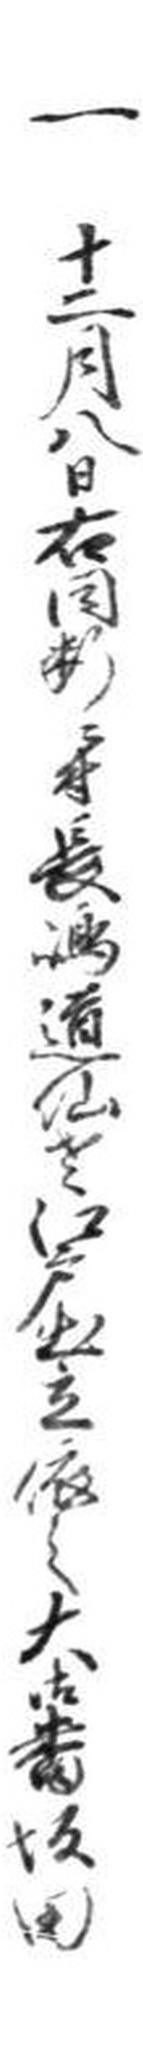一十二月八日右同断ニ付長嶋道仙老江戸出立依之大御番坂田
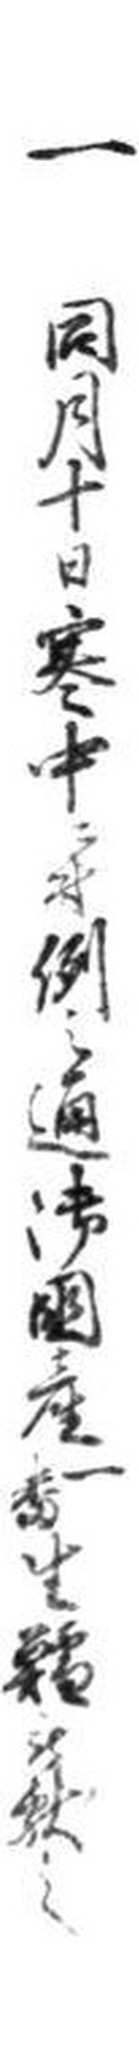一同月十日寒中ニ付例之通御国産一番生鱈被献之
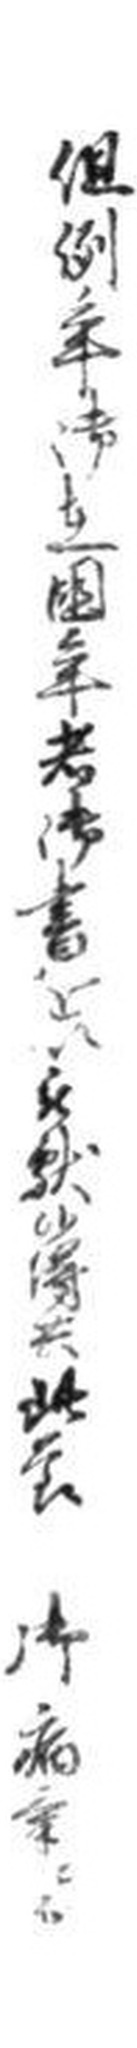但例年御在国年者御書を以被献候得共此節御病気ニ付
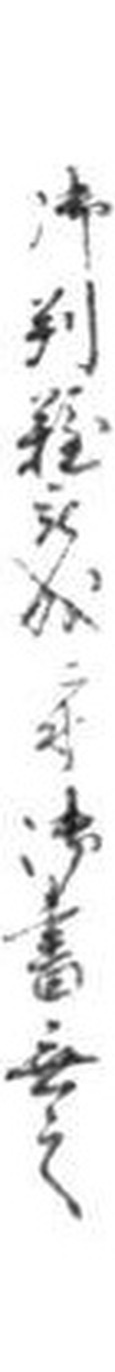御判難被成ニ付御書無之
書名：家譜 十七 吉品公 従元禄元年到同二年
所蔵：福井県文書館 Fukui Prefectural Archives
